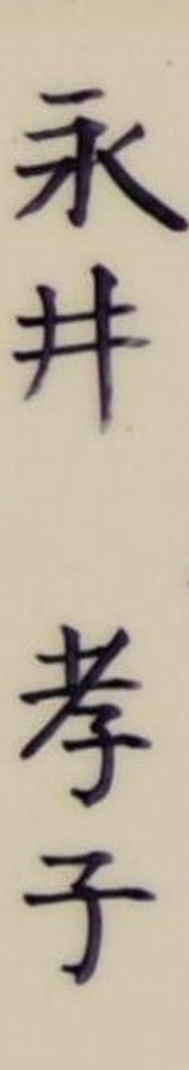永井孝子
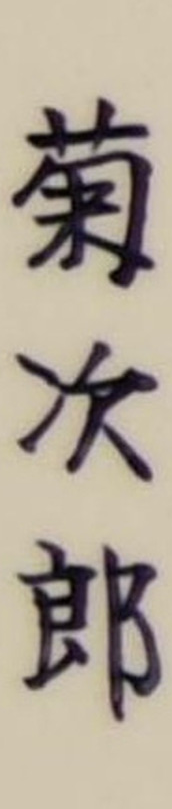菊次郎
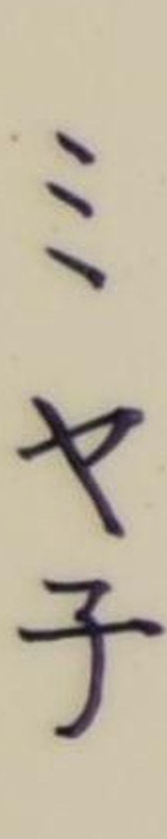ミヤ子
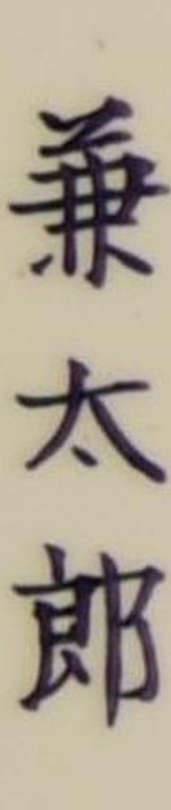兼太郎

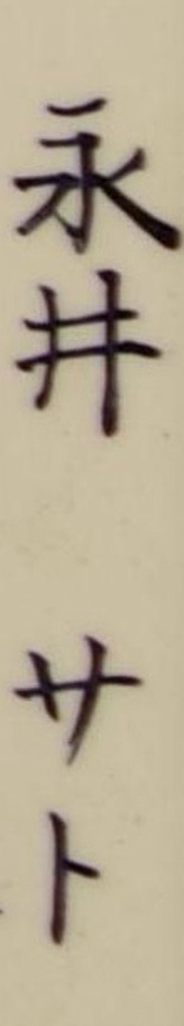永井サト
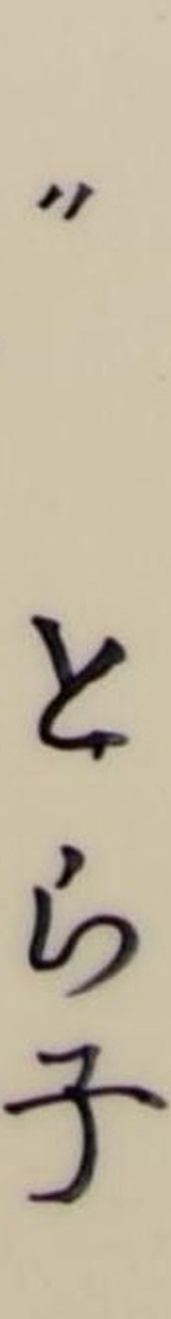とら子
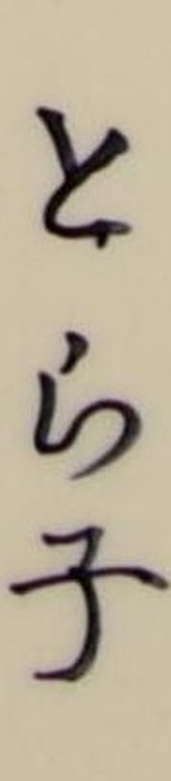とら子
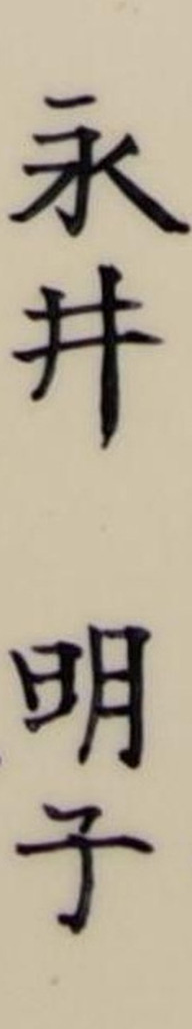永井明子
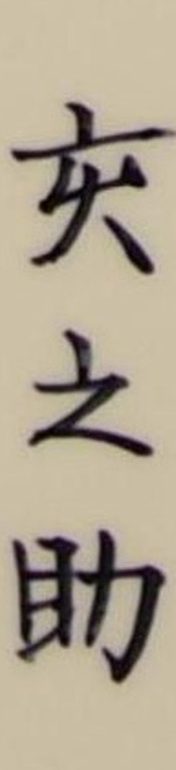亥之助
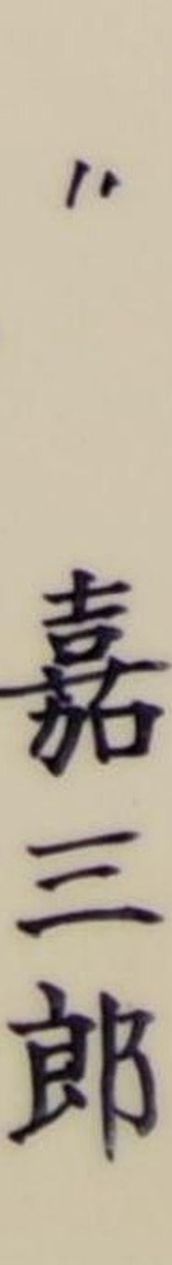嘉三郎
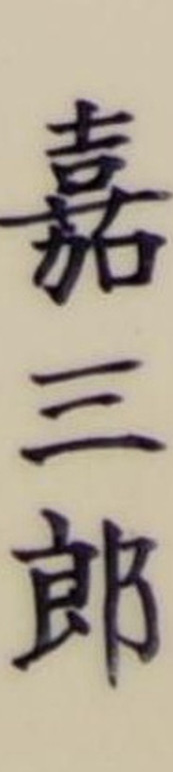嘉三郎
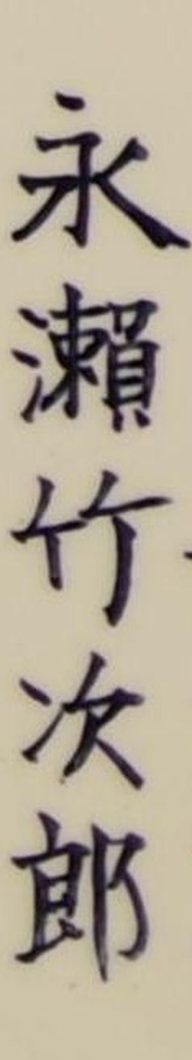永瀬竹次郎

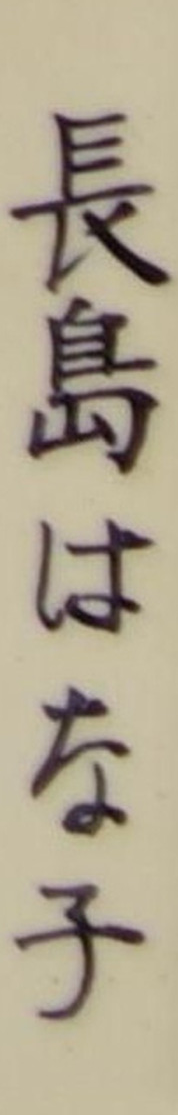長島はな子
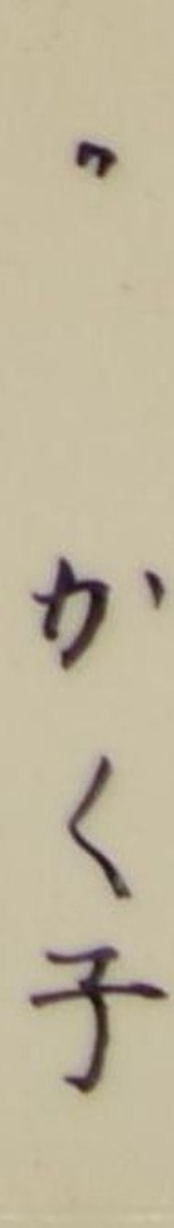かく子
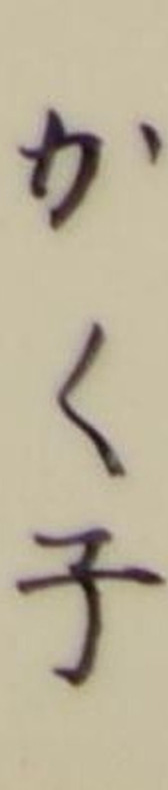かく子
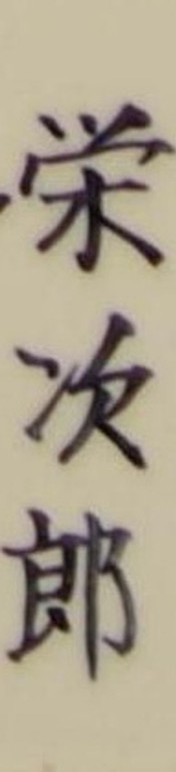栄次郎
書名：A~D
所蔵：koyasan kongobuji
